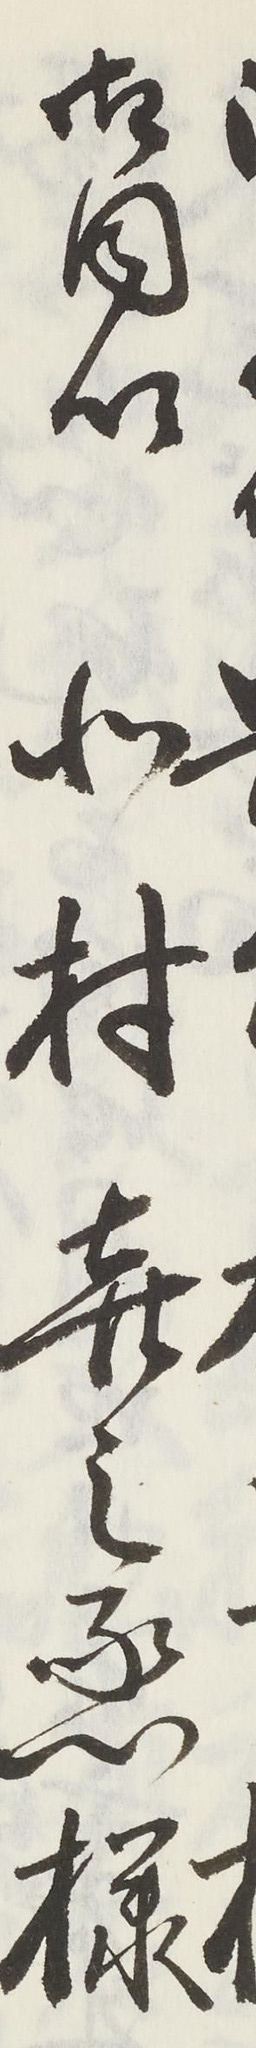御同心北村喜之丞様
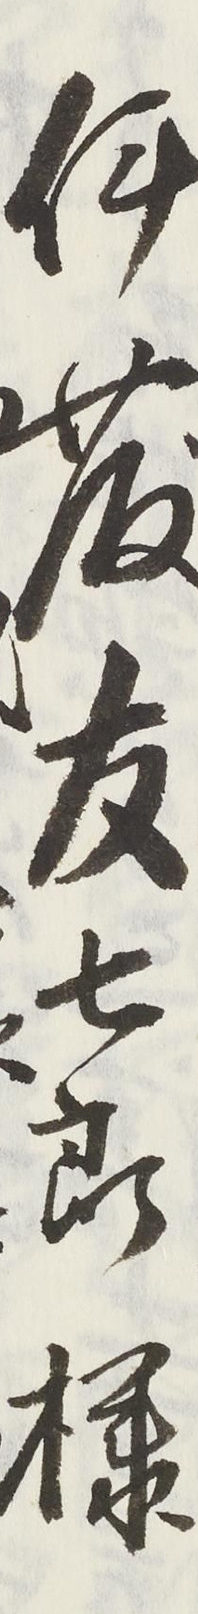伊藤友七郎様
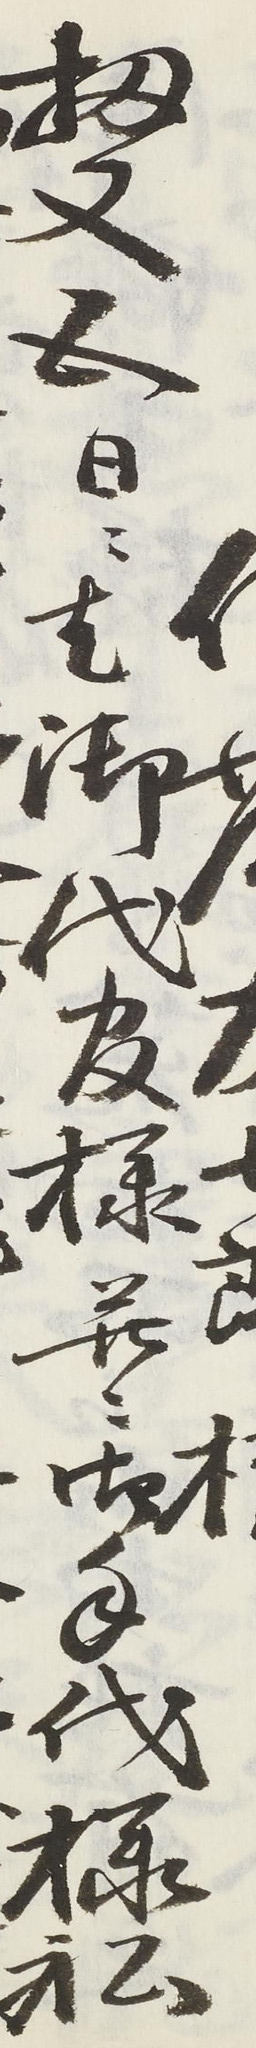扨又五日二は御代官様并二御手代様船
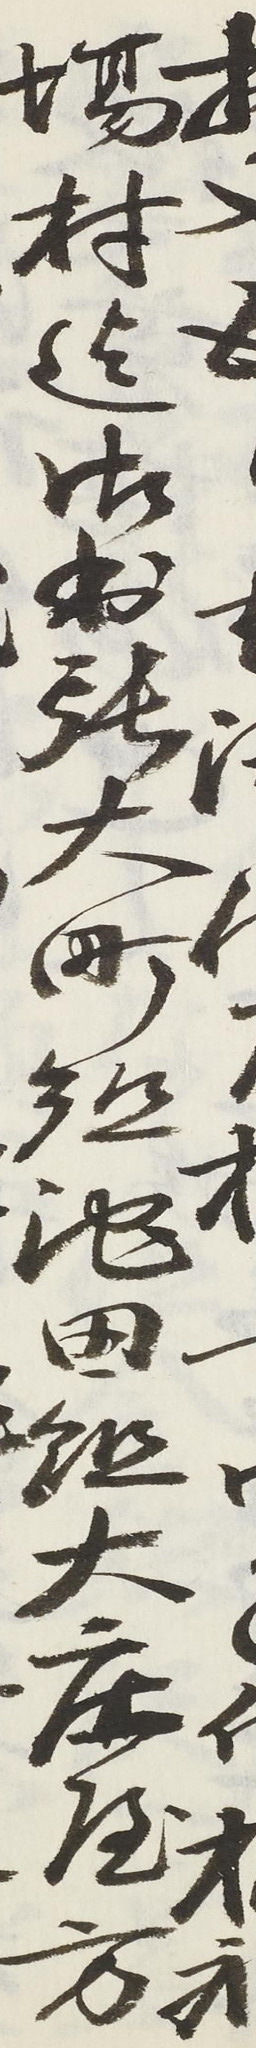場村迄御出張大町組池田組大庄屋方
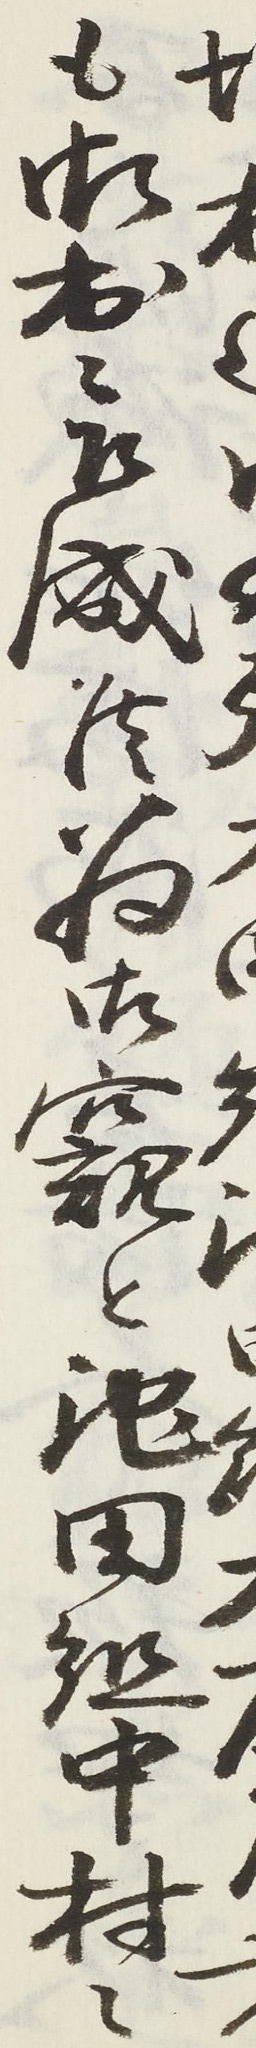も御出二被成候為御窺と池田組中村々
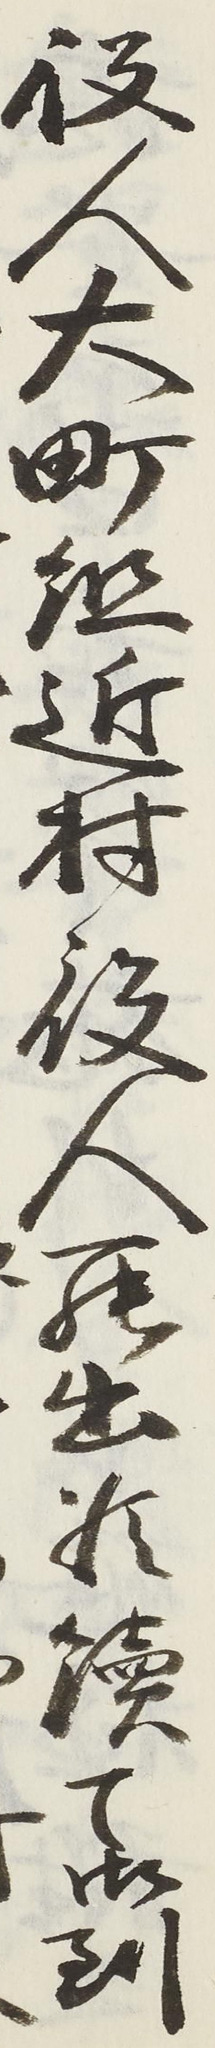役人大町組近村役人罷出候続て御到
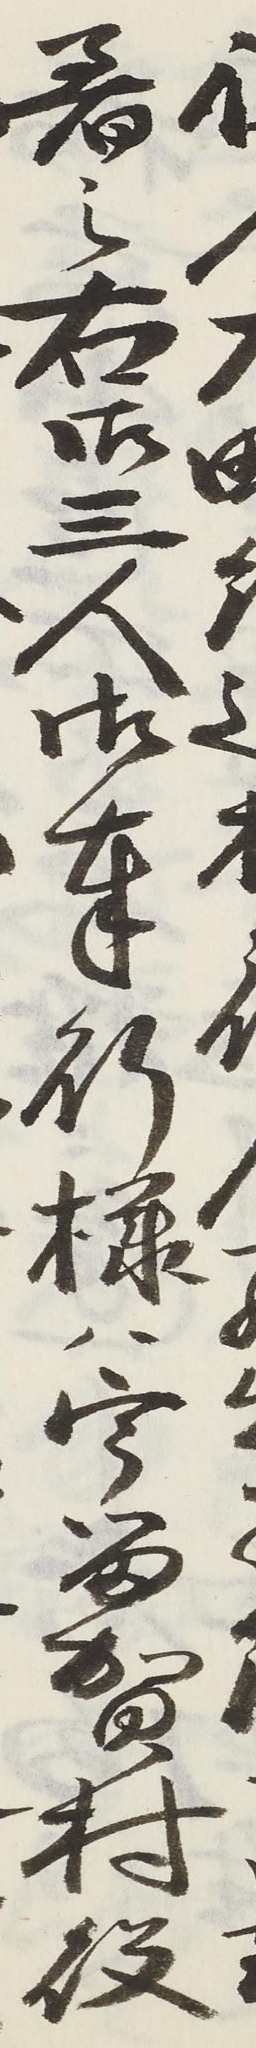着之右御三人御奉行様ハ宇留賀村役
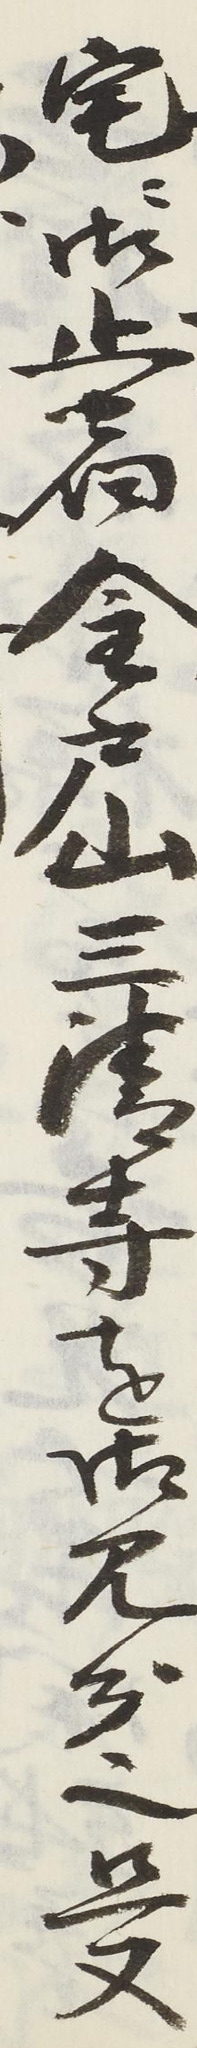宅二御止宿金戸山三清寺を御見分也且又
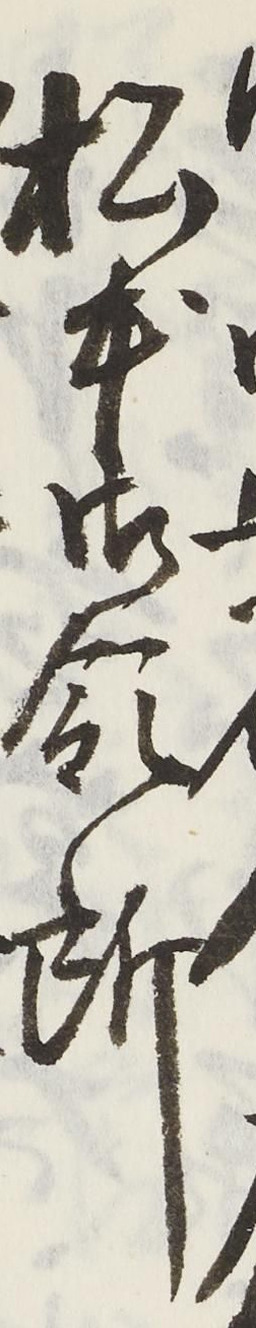松本御領所
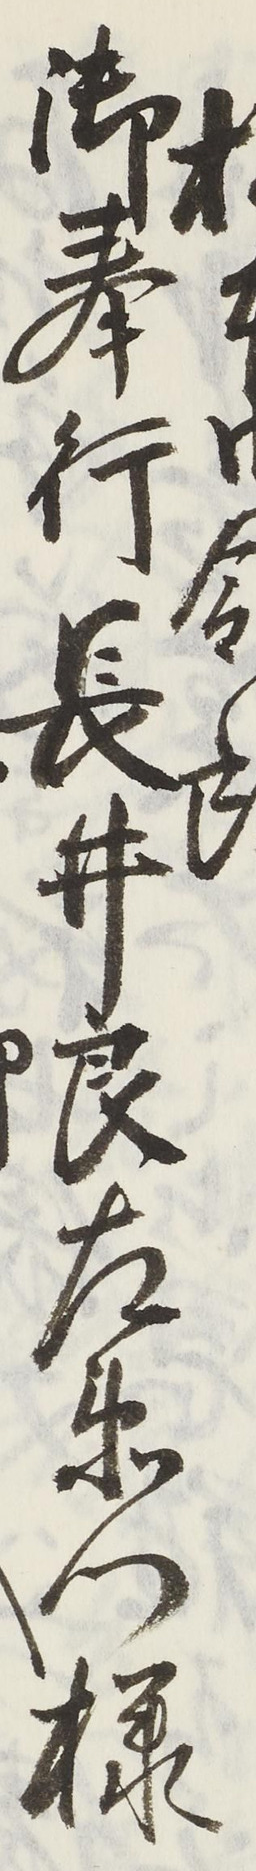御奉行長井良左衛門様
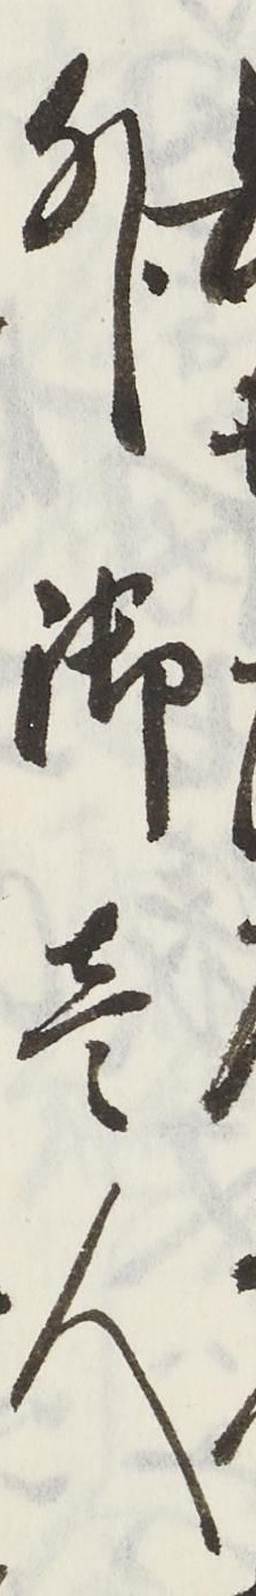外御壱人
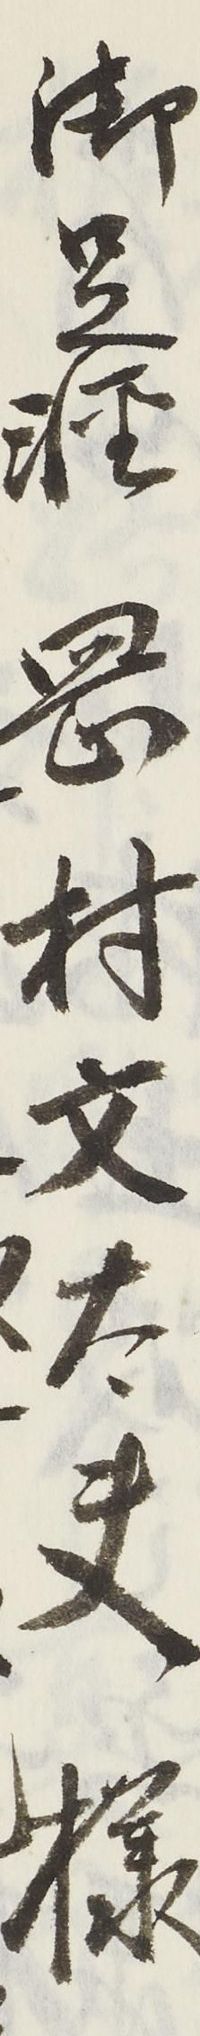御足軽岡村文太夫様
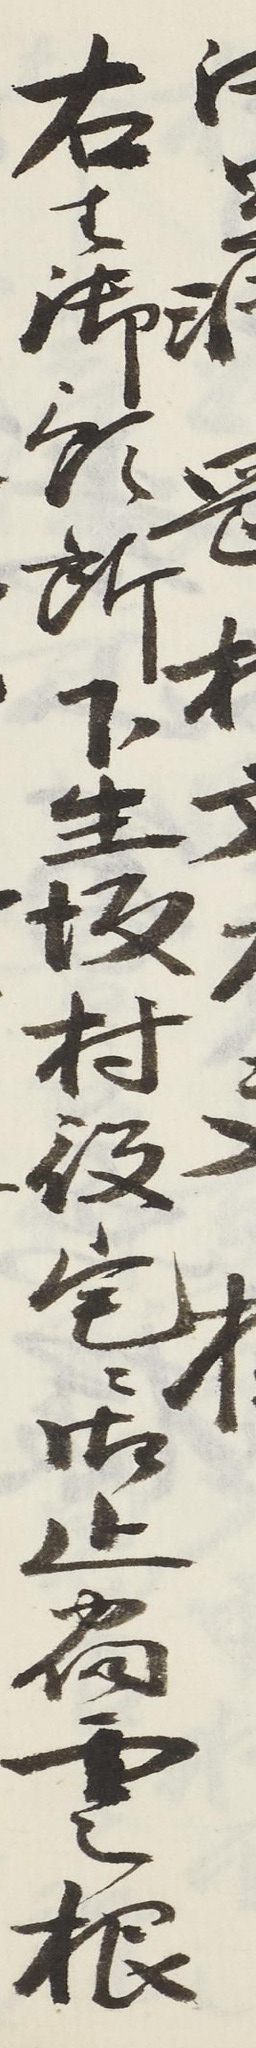右は御預所下生坂村役宅二御宿雲之根
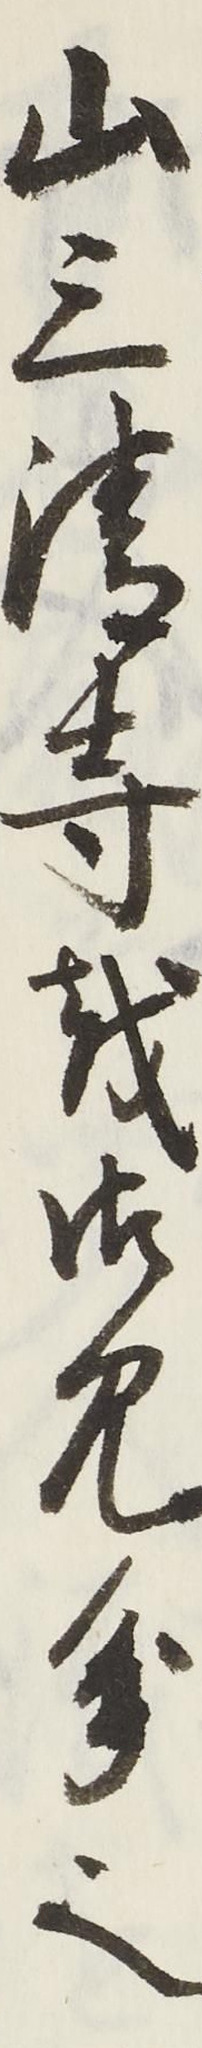山三清寺を御見分也
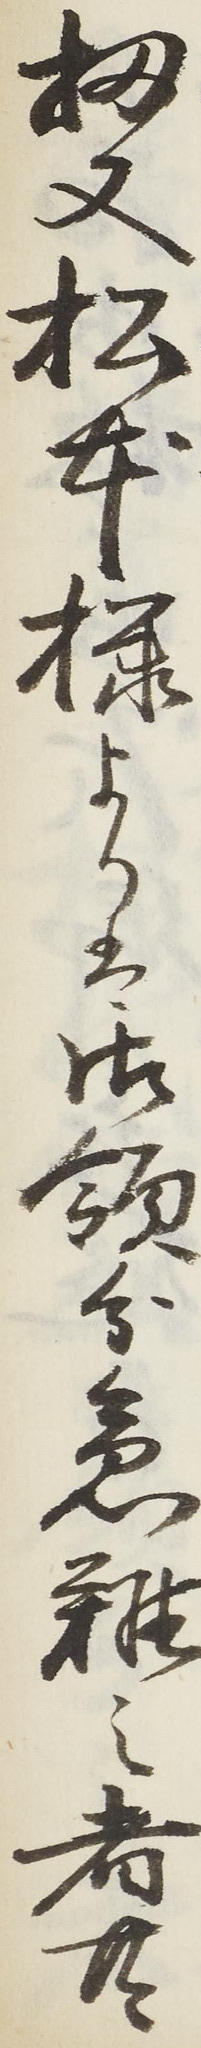扨又松平様よりは御領分急難之者共

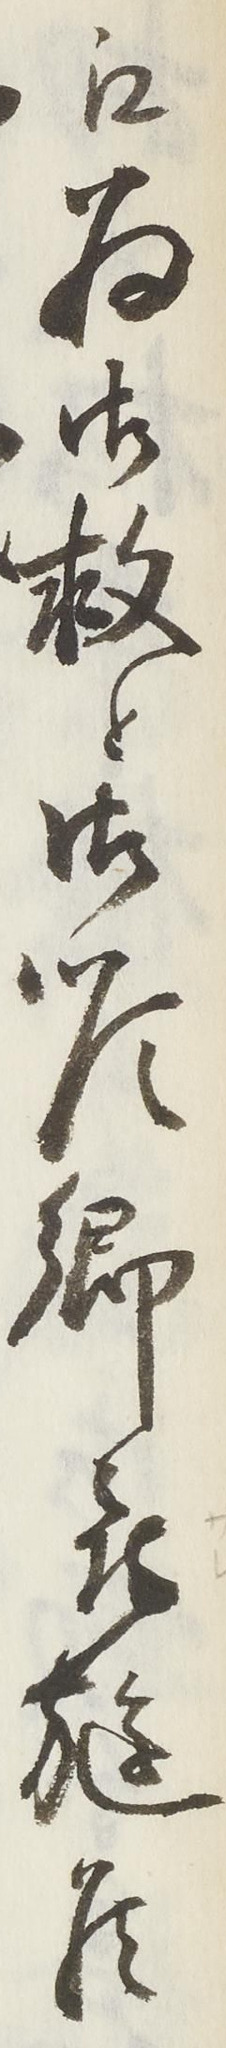江為御救と御順郷被遊候
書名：弘化四年地震記
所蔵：東京大学地震研究所図書室 Earthquake Research Institute Library, The University of Tokyo, JAPAN
